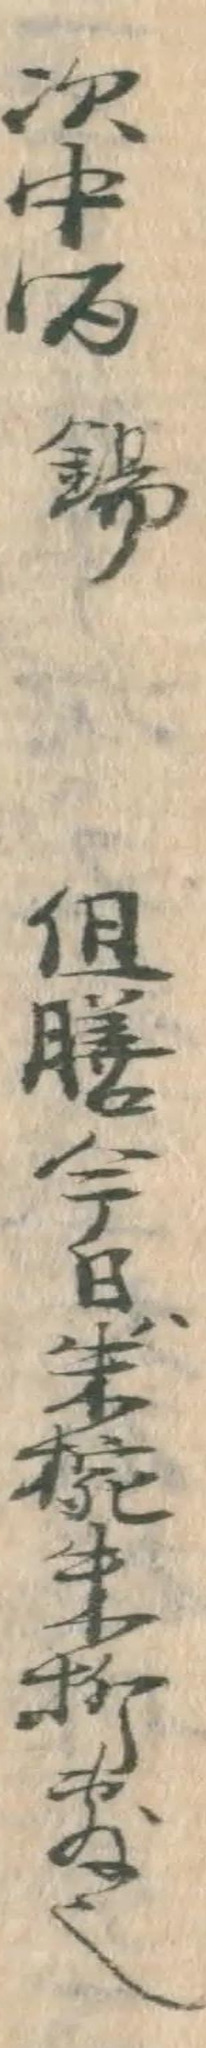次中酒錫但膳今日米椀来折敷也
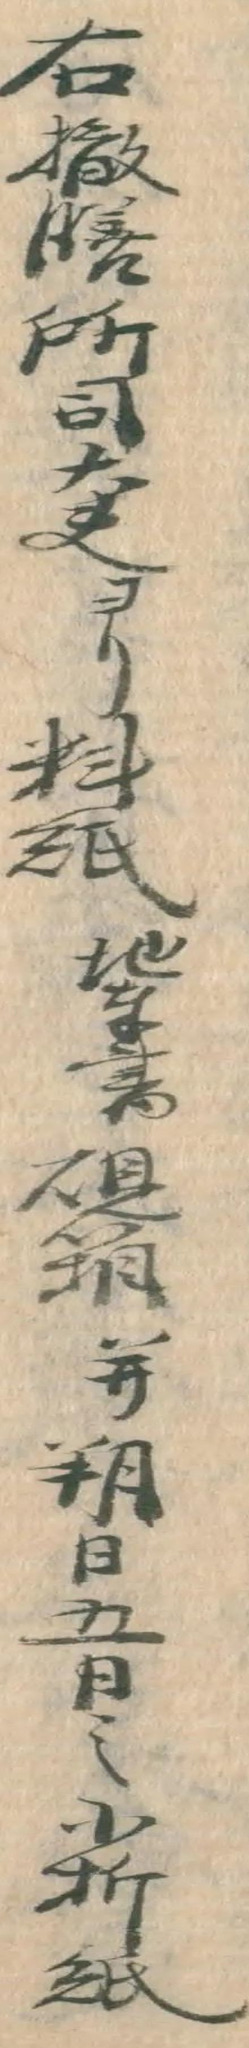右撒膳所司大夫ヨリ料紙地奉書硯箱幷朔日五日之小折紙
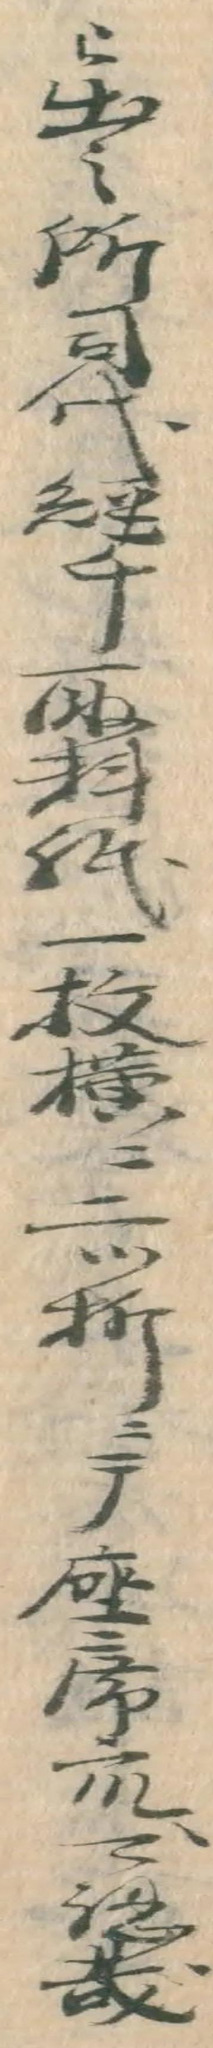被出之所司代経千取料紙一枚横ニ二ツ折ニテ座席衆可認哉

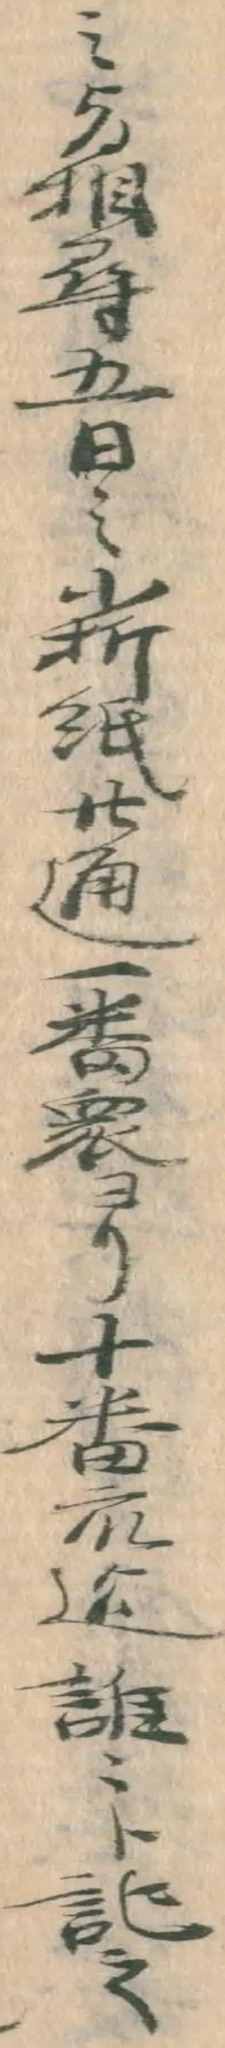之旨相尋五日之小折紙廿通一番衆ヨリ十番衆迄誰々ト記之
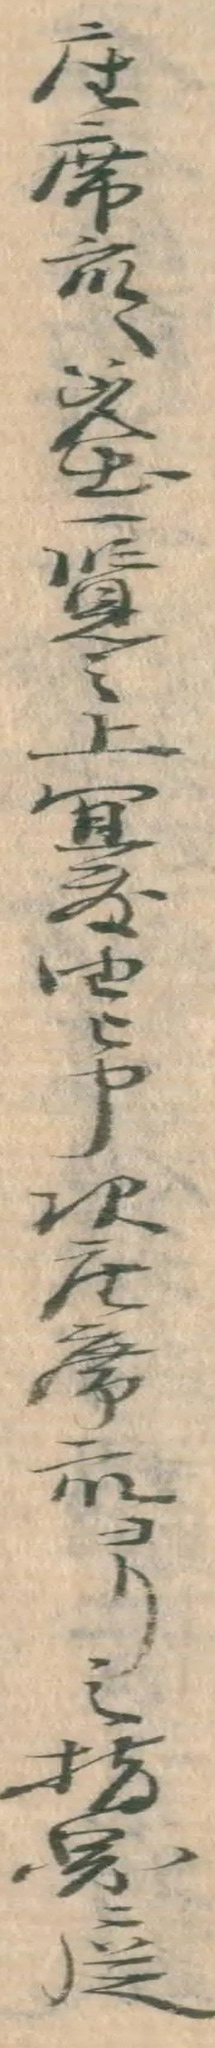座席衆へ差出一覧之上宜敷由被申次座席衆ヨリ之指図に従
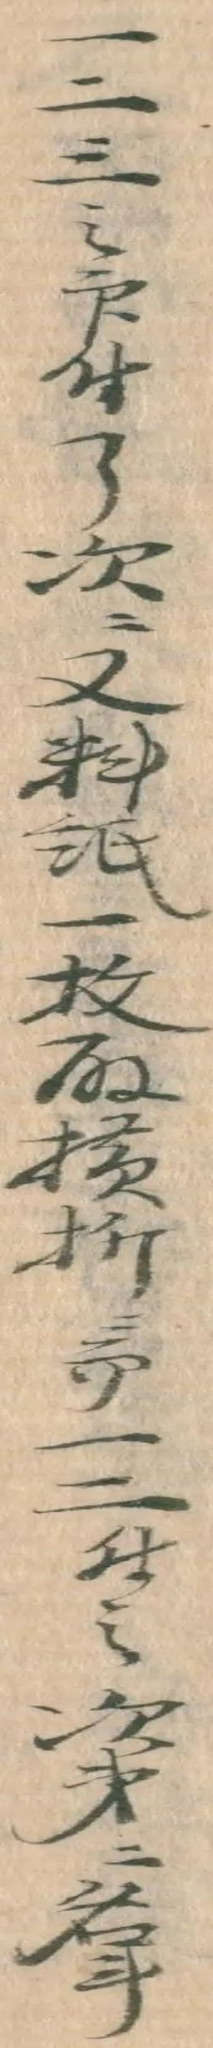一二三之印付了次に又料紙一枚取横折ニ而一二付之次第に名斗
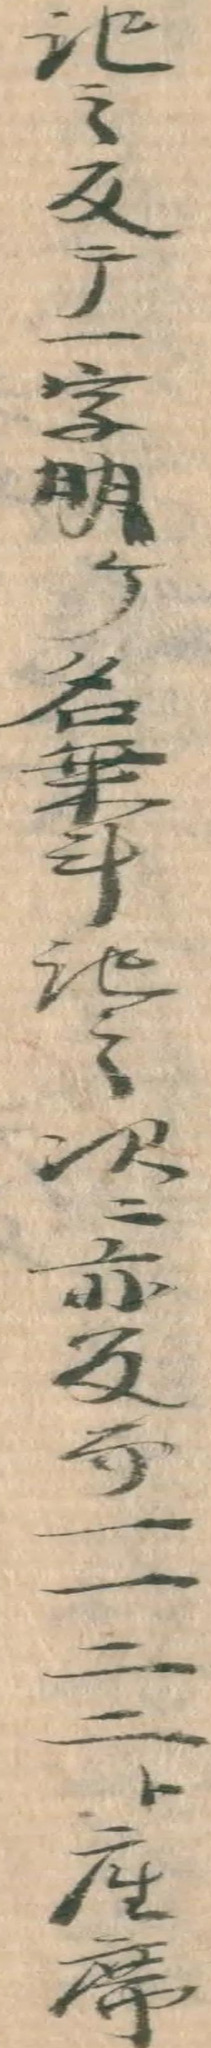記之反テ一字明ケ名乗斗記之次ニ亦反而一一二二ト座席
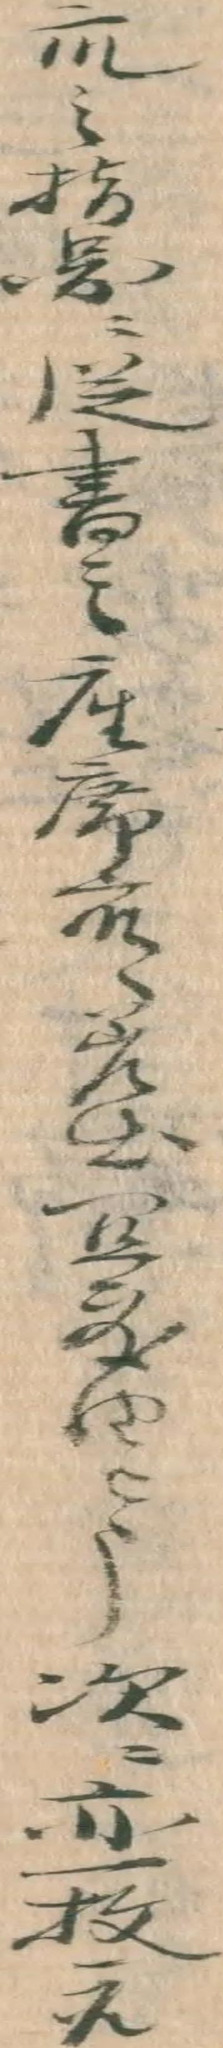衆之指図に従書之座席衆へ差出宜敷由被申次に亦一枚取
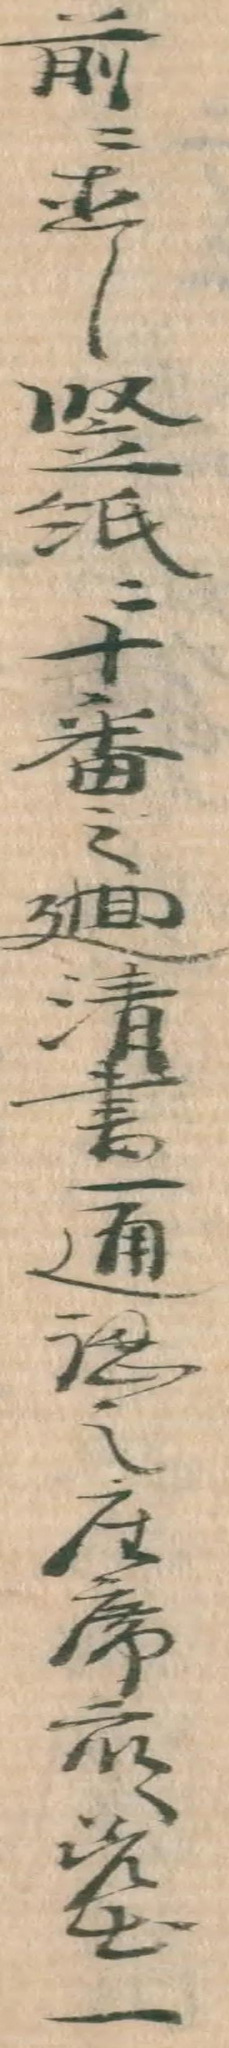前ニ直し竪紙ニ十番之廻清書一通認之座席衆へ差出一
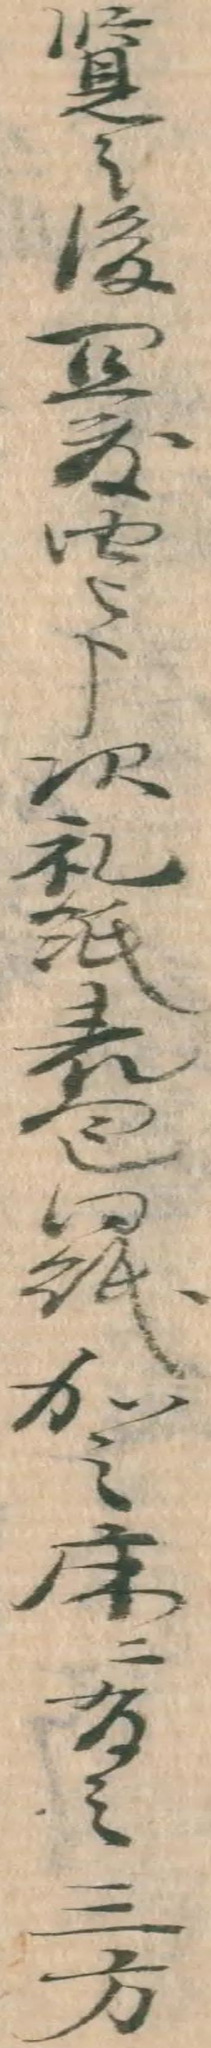覧之後宜敷由被申次礼紙表包同紙加之床ニ有之三方
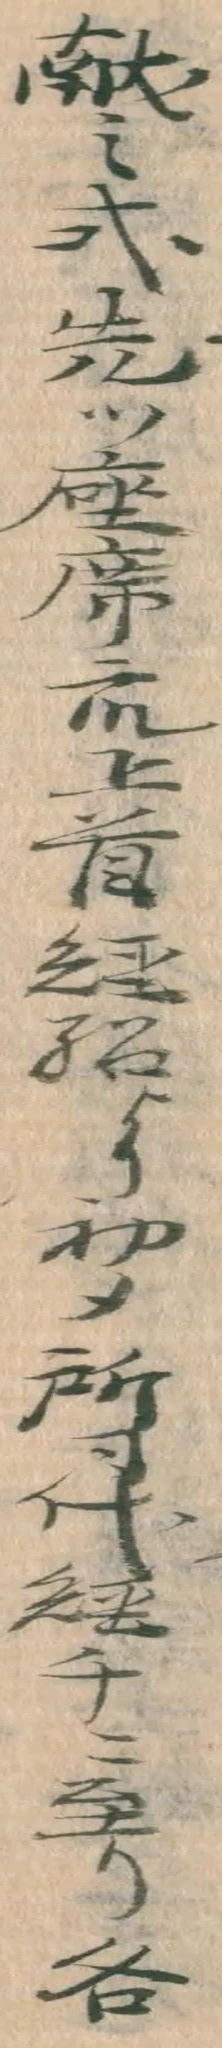献之式先ツ座席衆上首経招より初〆所司代経千ニ至リ各
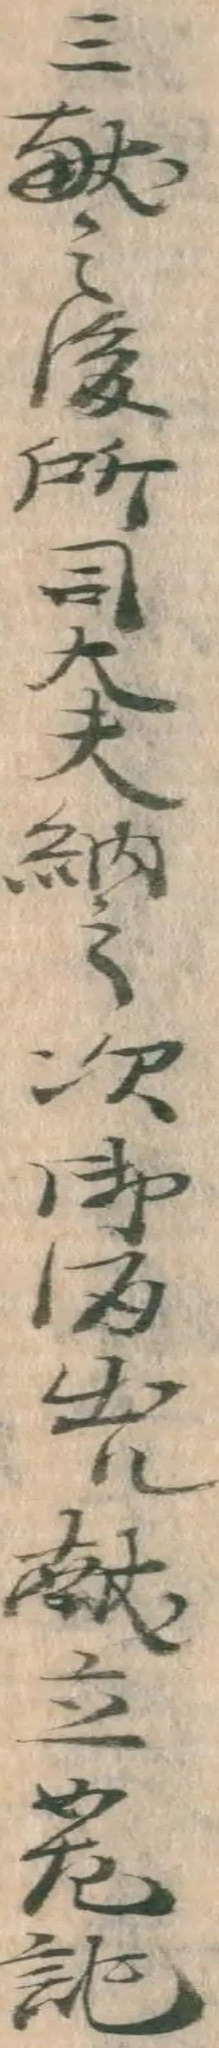三献之後所司大夫納之次御酒出ル献立如左記
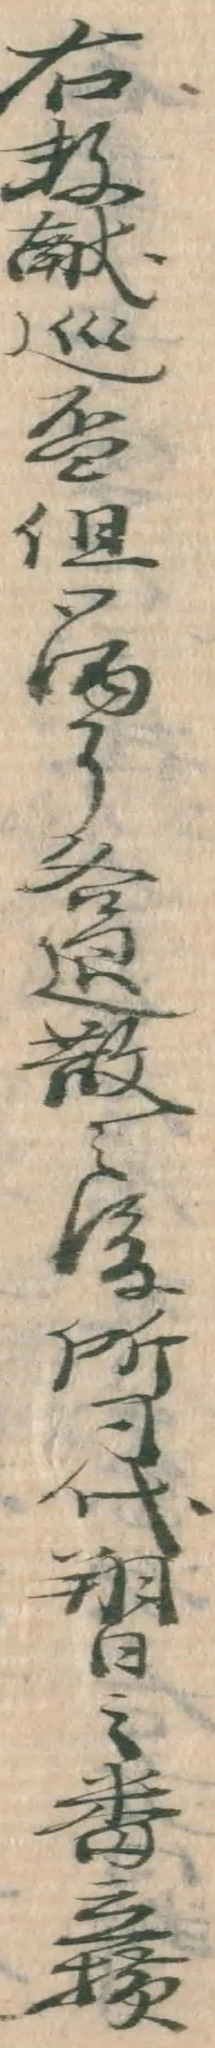右数献巡盃但御酒了各退散之後所司代朔日之番立横
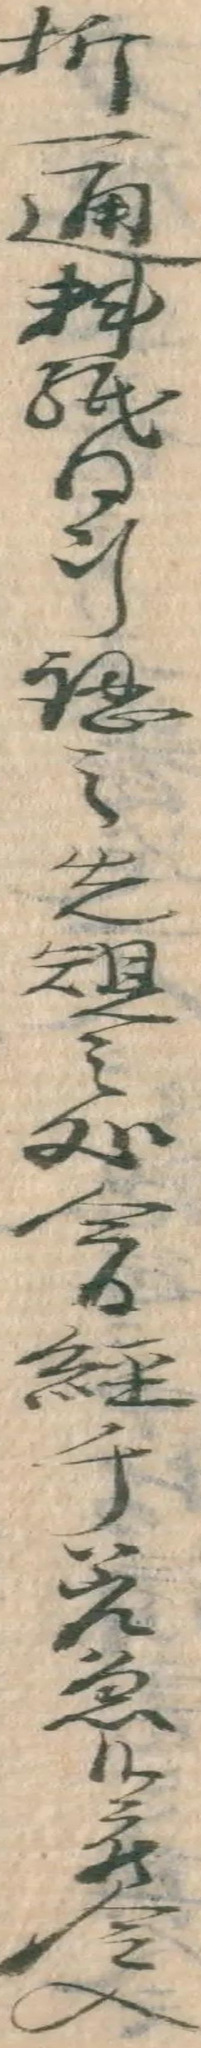折一通料紙同断認之先規之処今日経千差急候ニ付令入
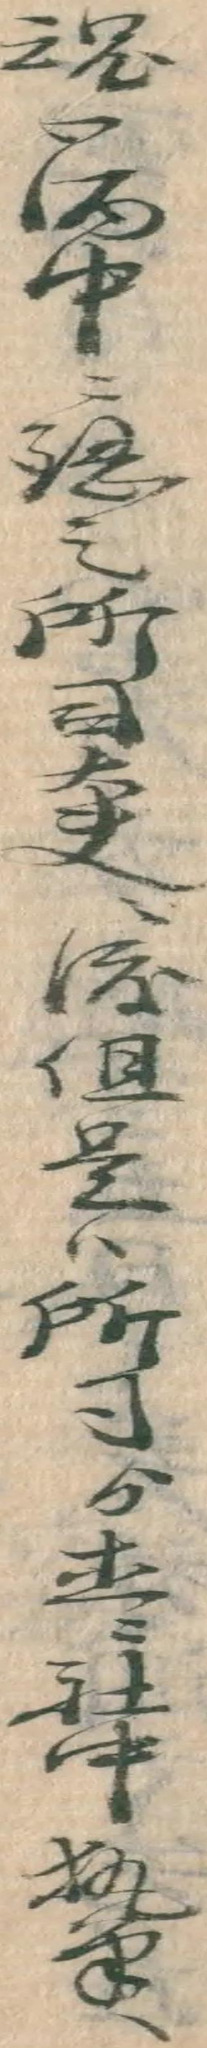祝御酒中に認之所司大夫へ渡但是ハ所司ゟ直に社中執筆へ
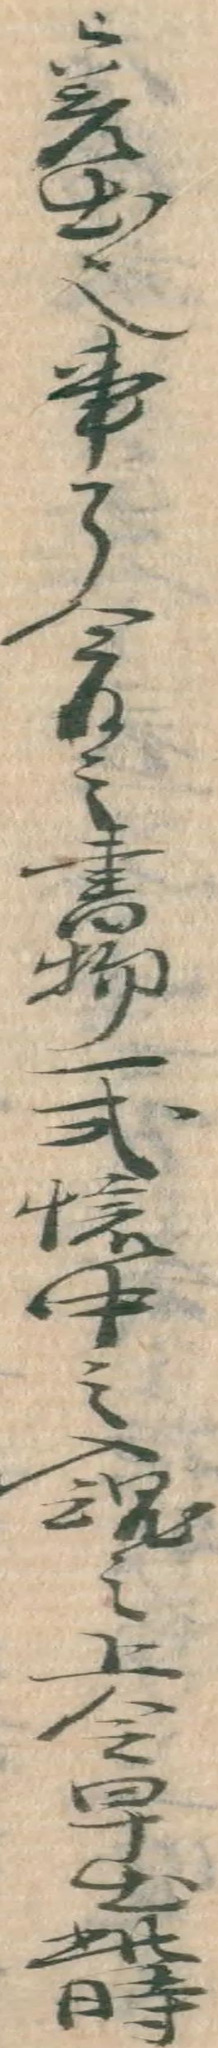被差出也事了今日之書物一式懐中之入魂之上令早出此時
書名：賀茂社記録. 第65冊
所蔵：国立国会図書館 National Diet Library, JAPAN
